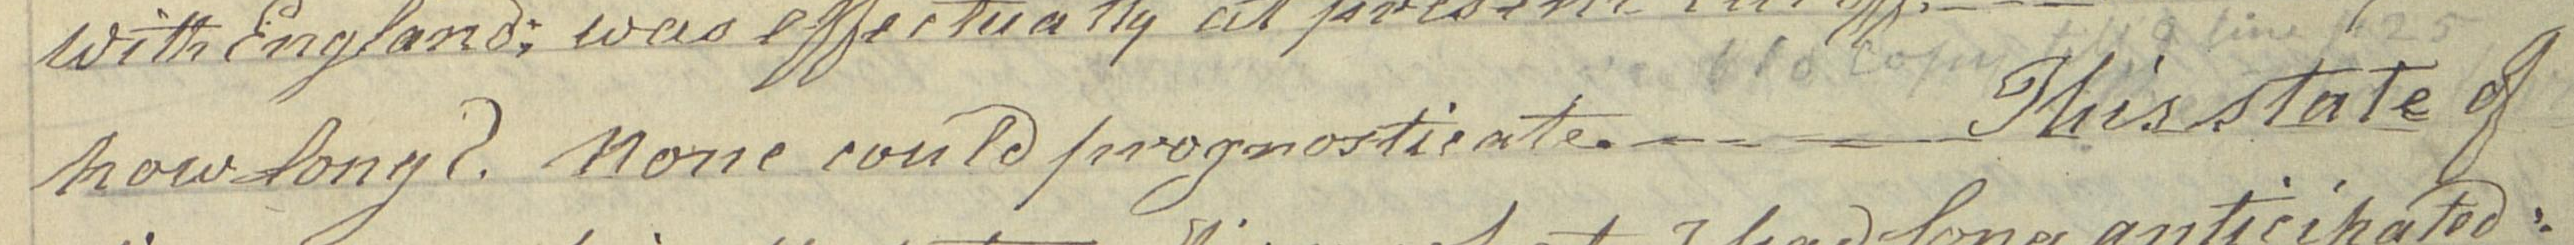how long? None could prognosticate. This state of
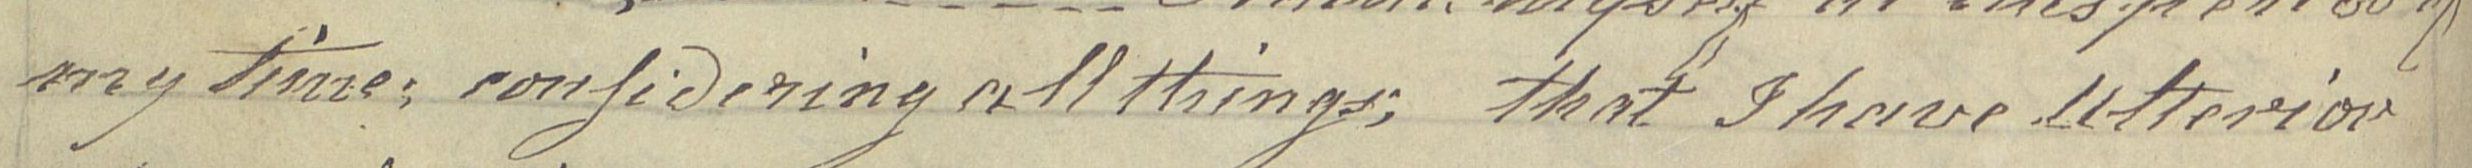my time: considering all things; that I have ulterior
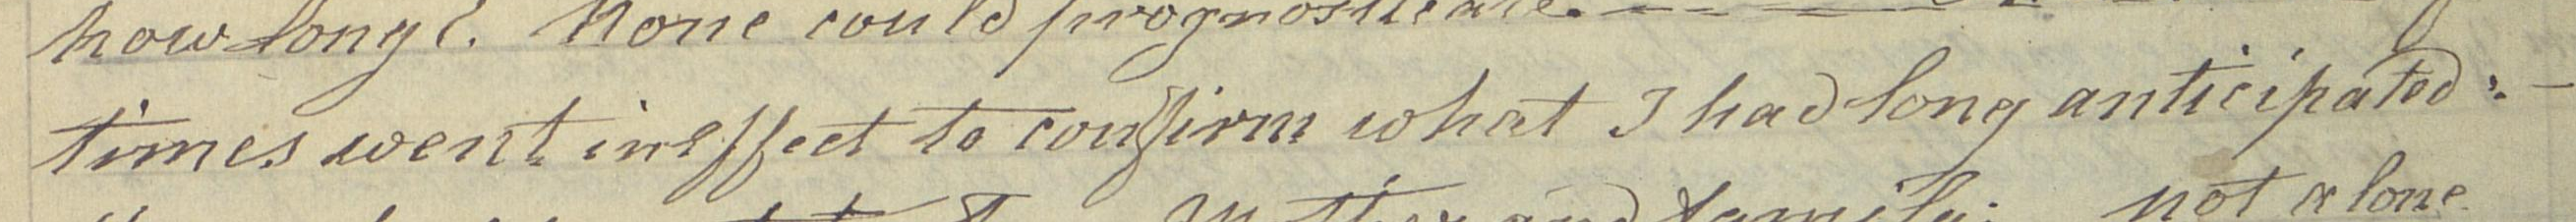times went in effect to confirm what I had long anticipated:
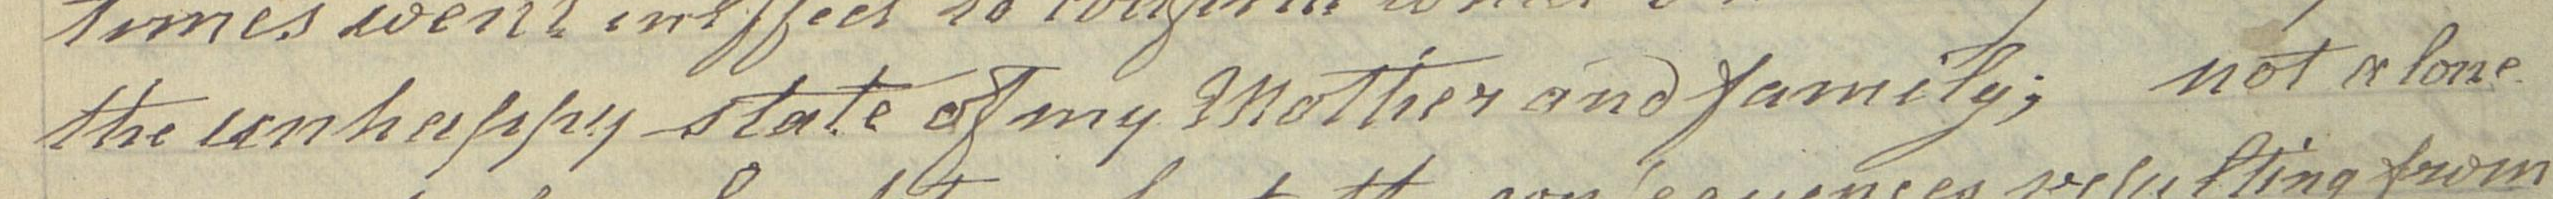the unhappy state of my Mother and family; not alone
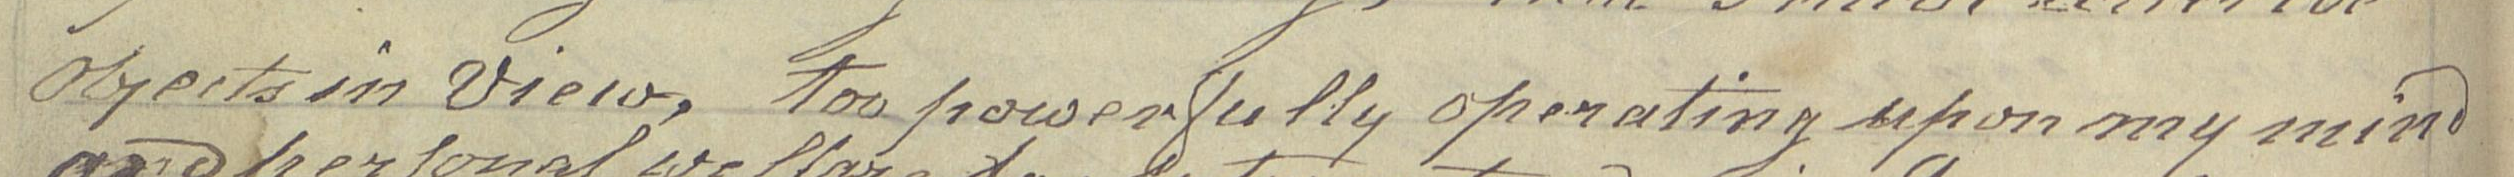Objects in View, too powerfully operating upon my mind
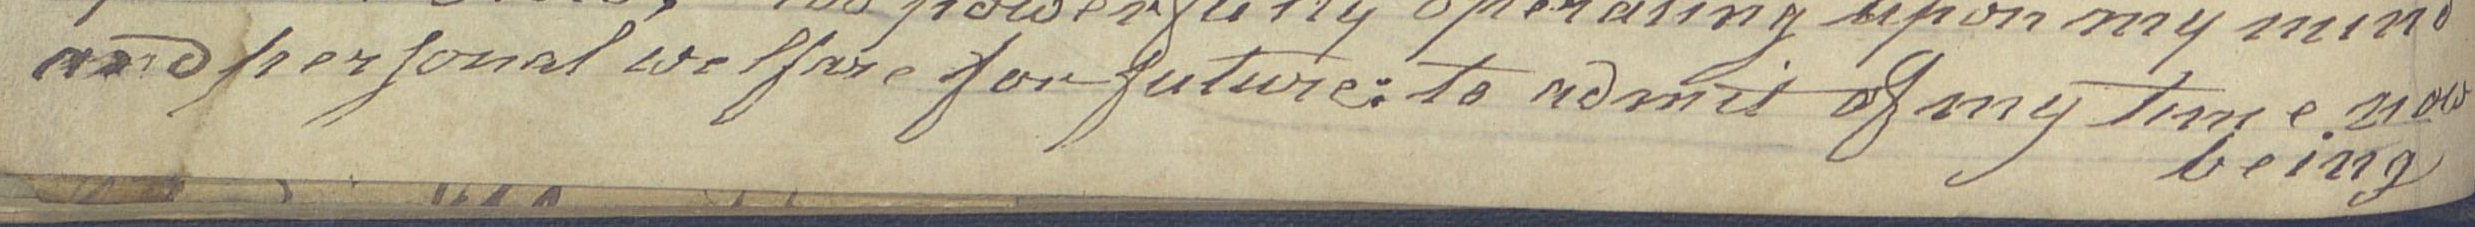and personal we fare for future: to admit of my time now
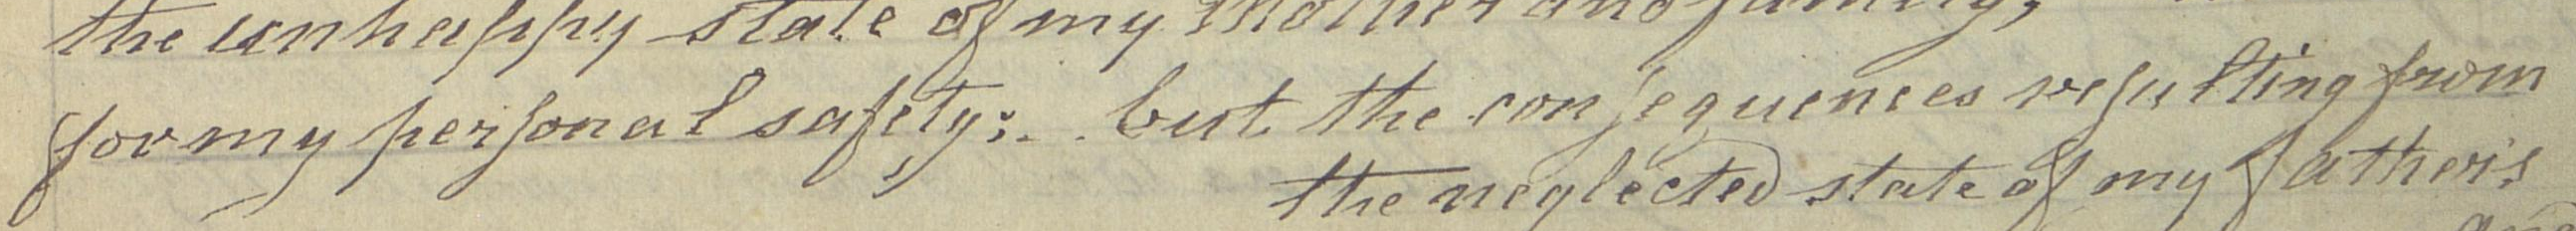for my personal safety; but the consequences resulting from
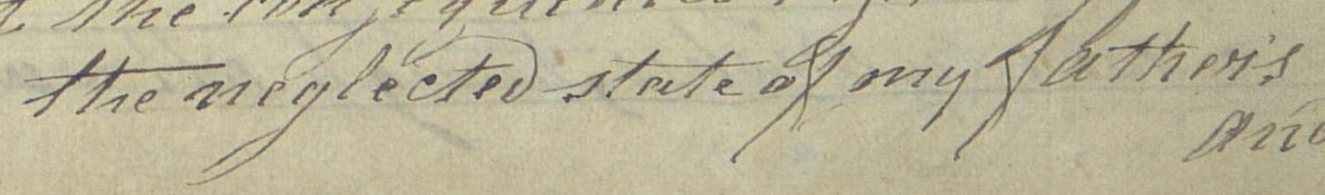the neglected state of my father's
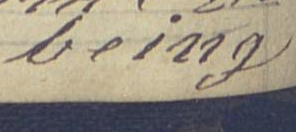being
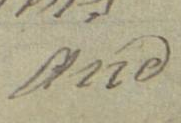and
